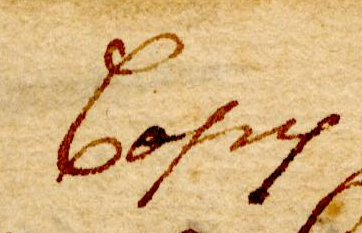Copy
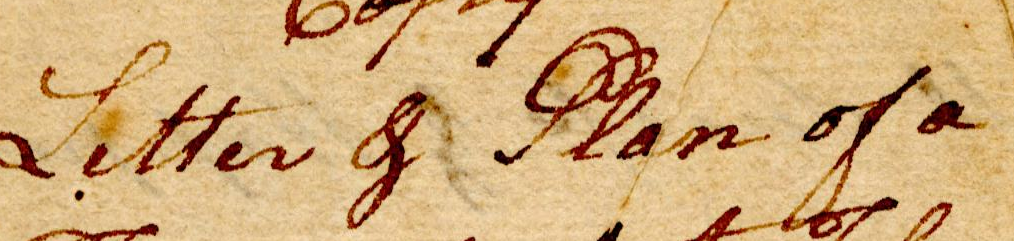Letters & Plan of a
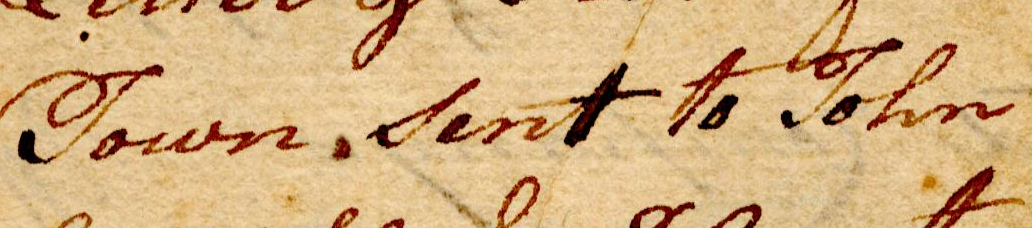Town sent to John
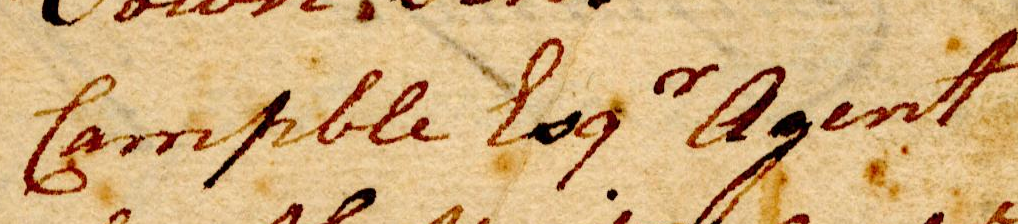Campble Esq^r agent
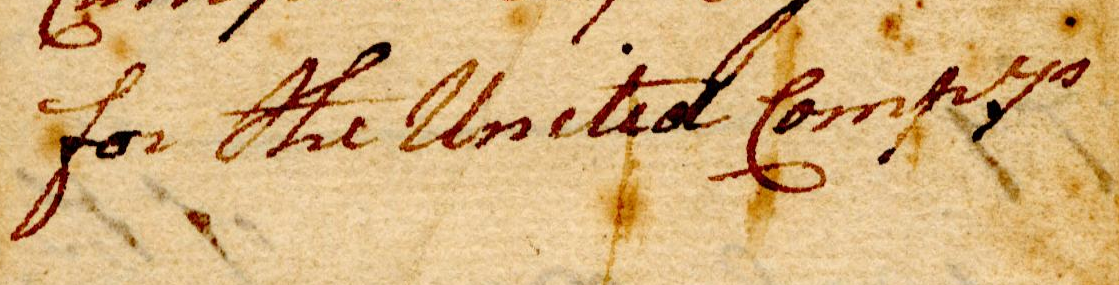for the United Comp^ys
